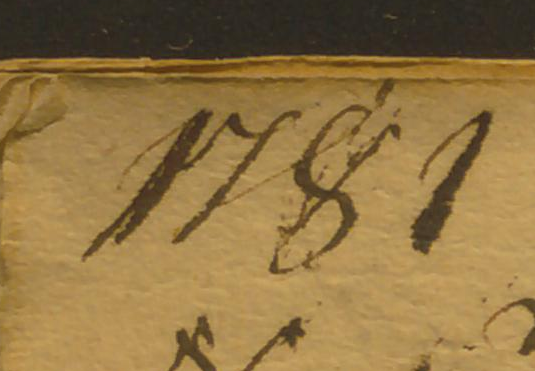1781
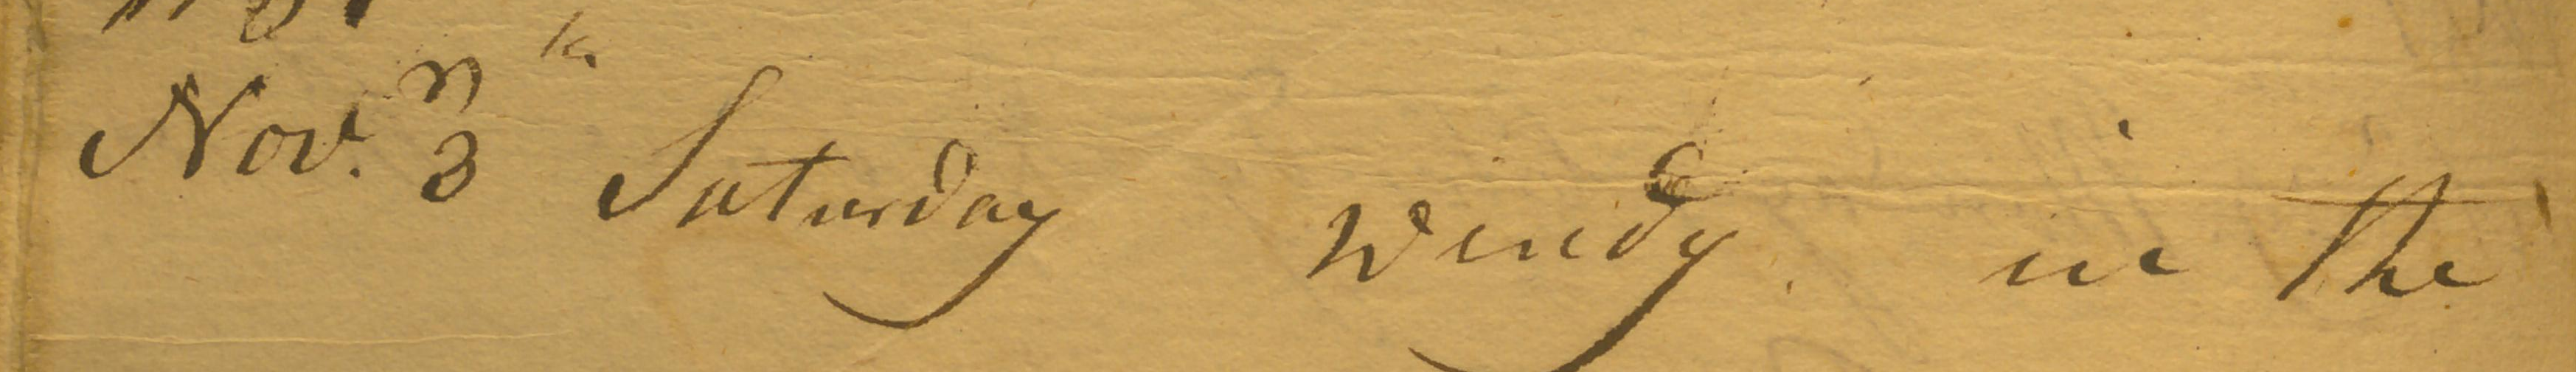Nov^r. 3^th Saturday windy, in the
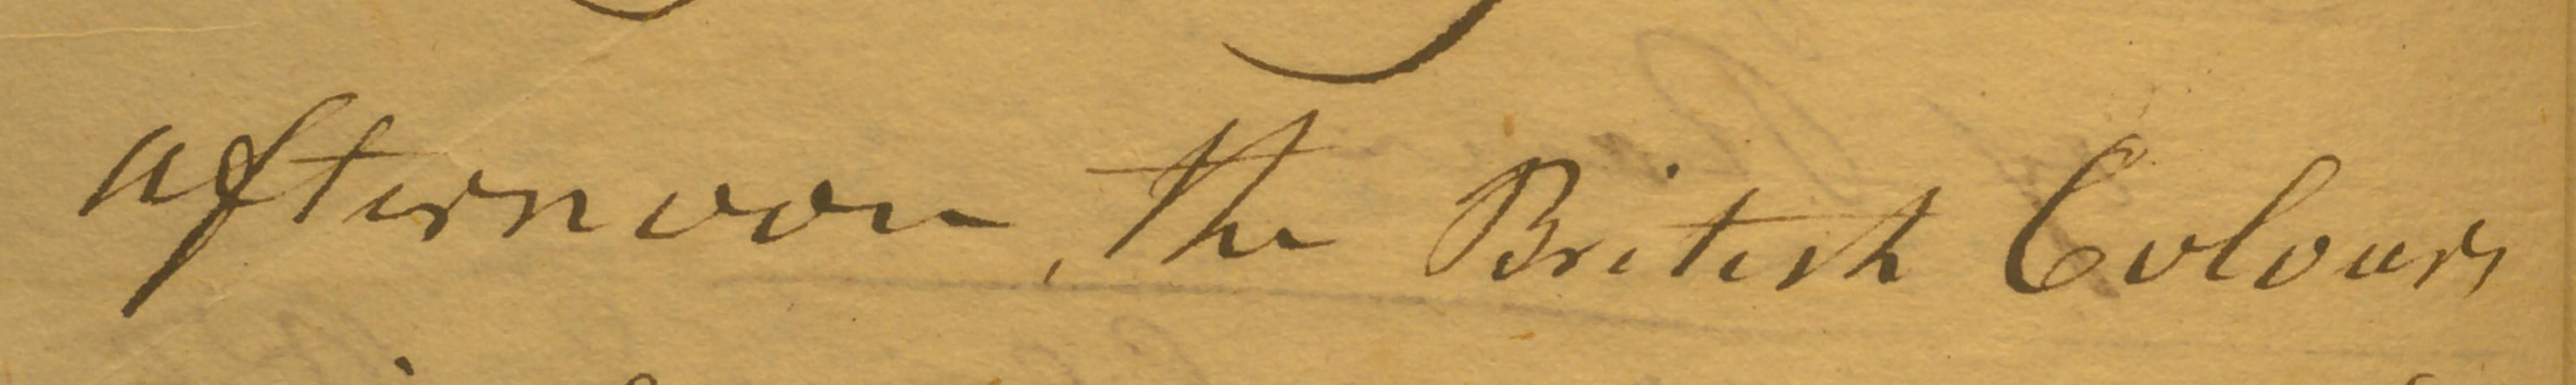afternoon the British Colours
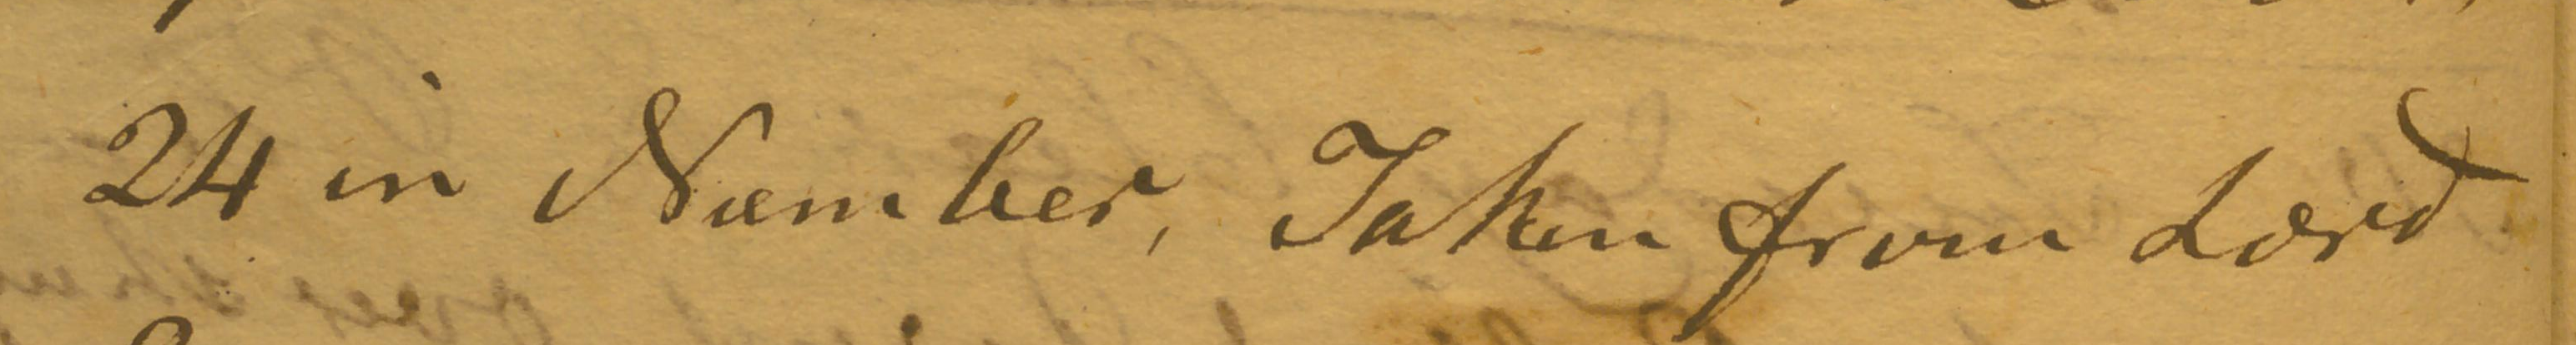24 in Number, Taken from Lord
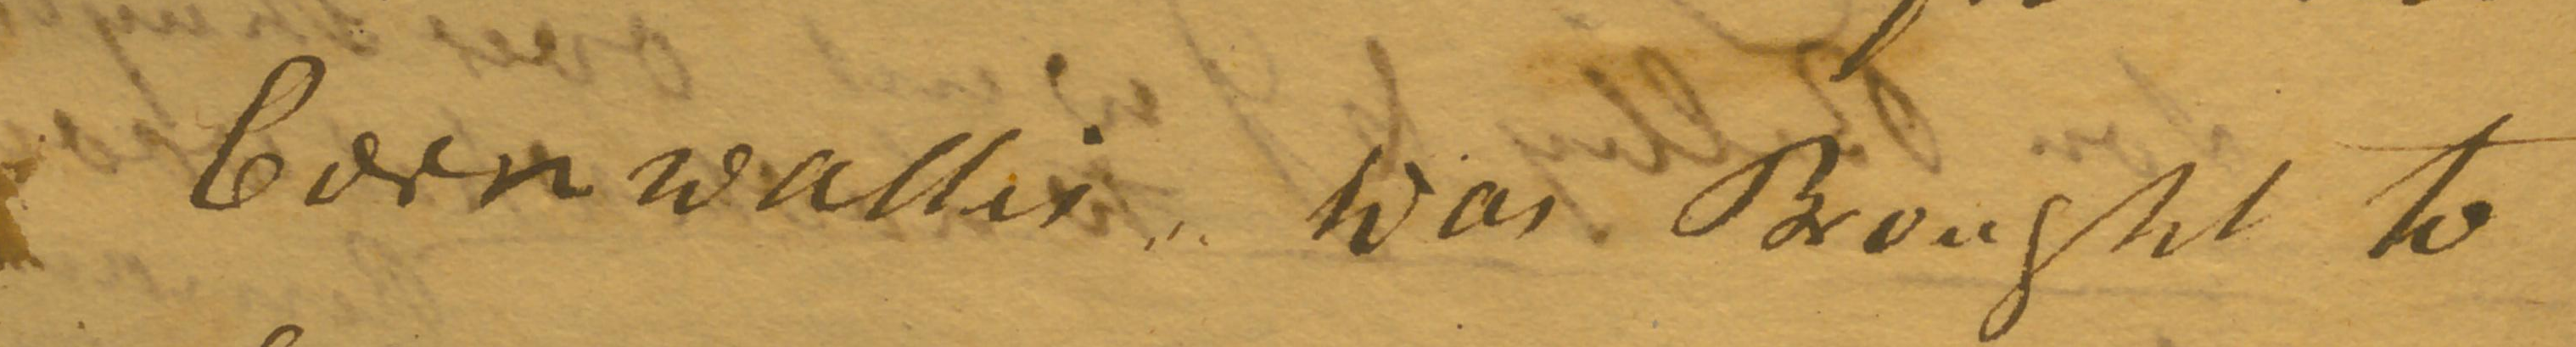Cornwallis, was Brought to
